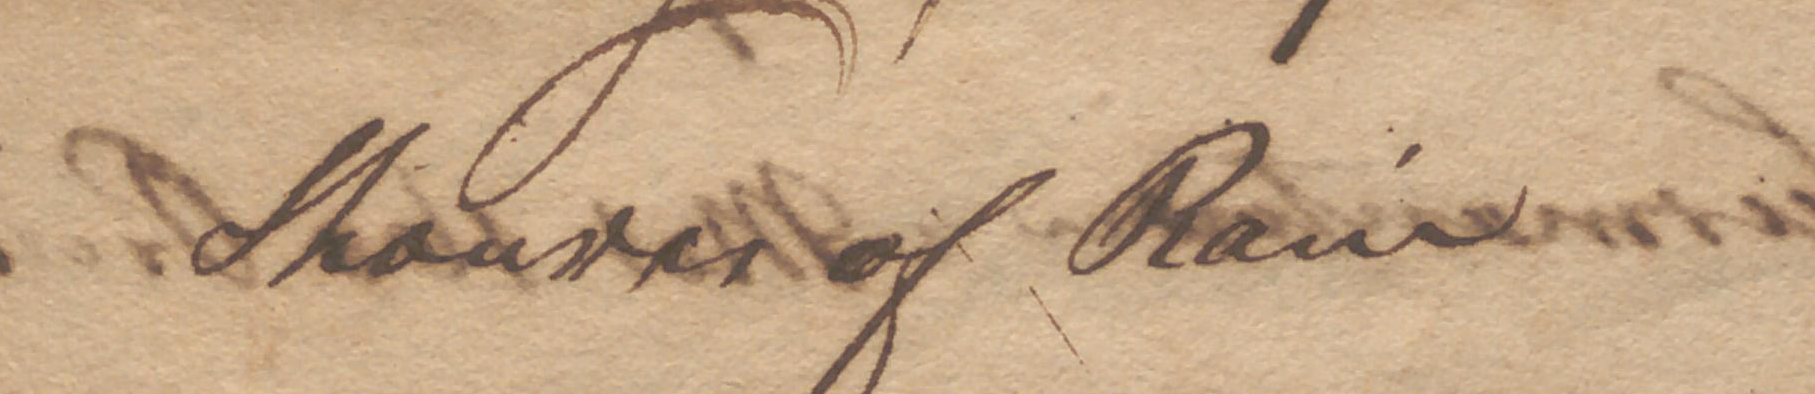Shoures of Rain
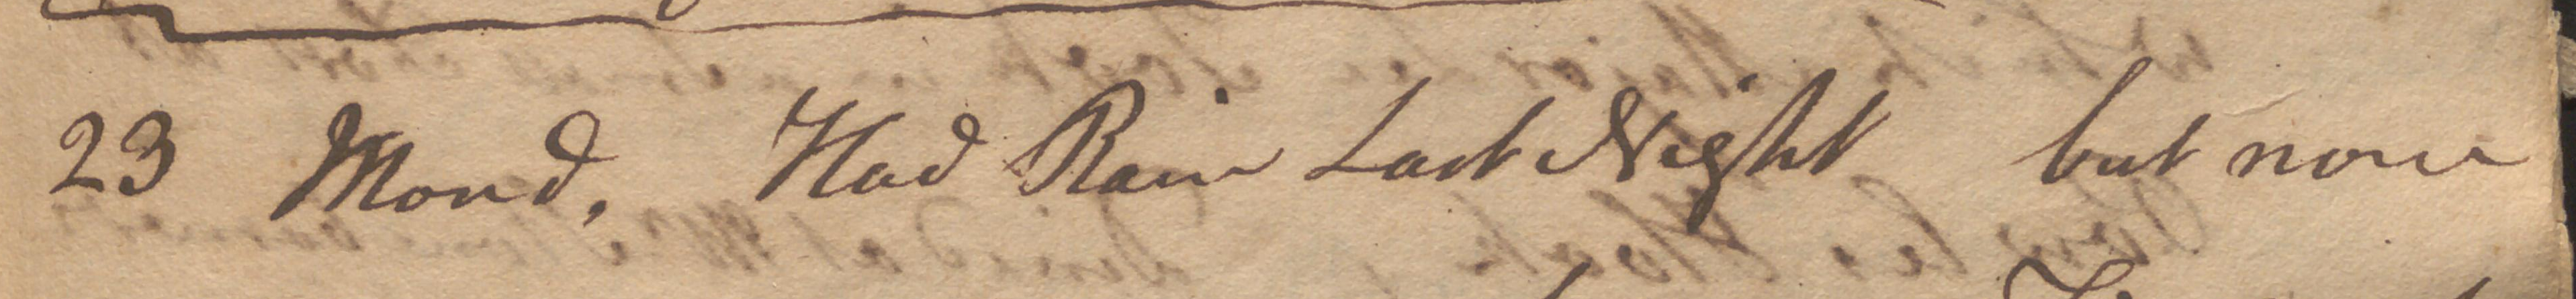23 Mond. Had Rain Last Night, but now
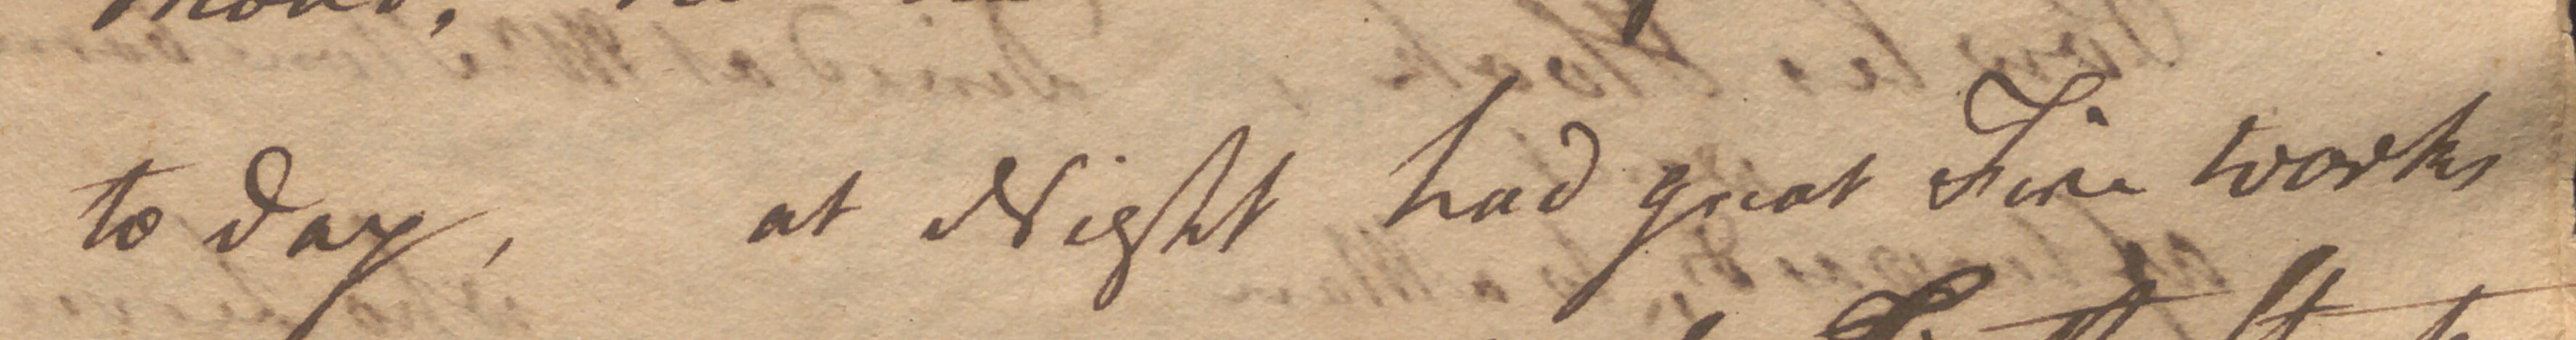to day, at Night had great Fire works
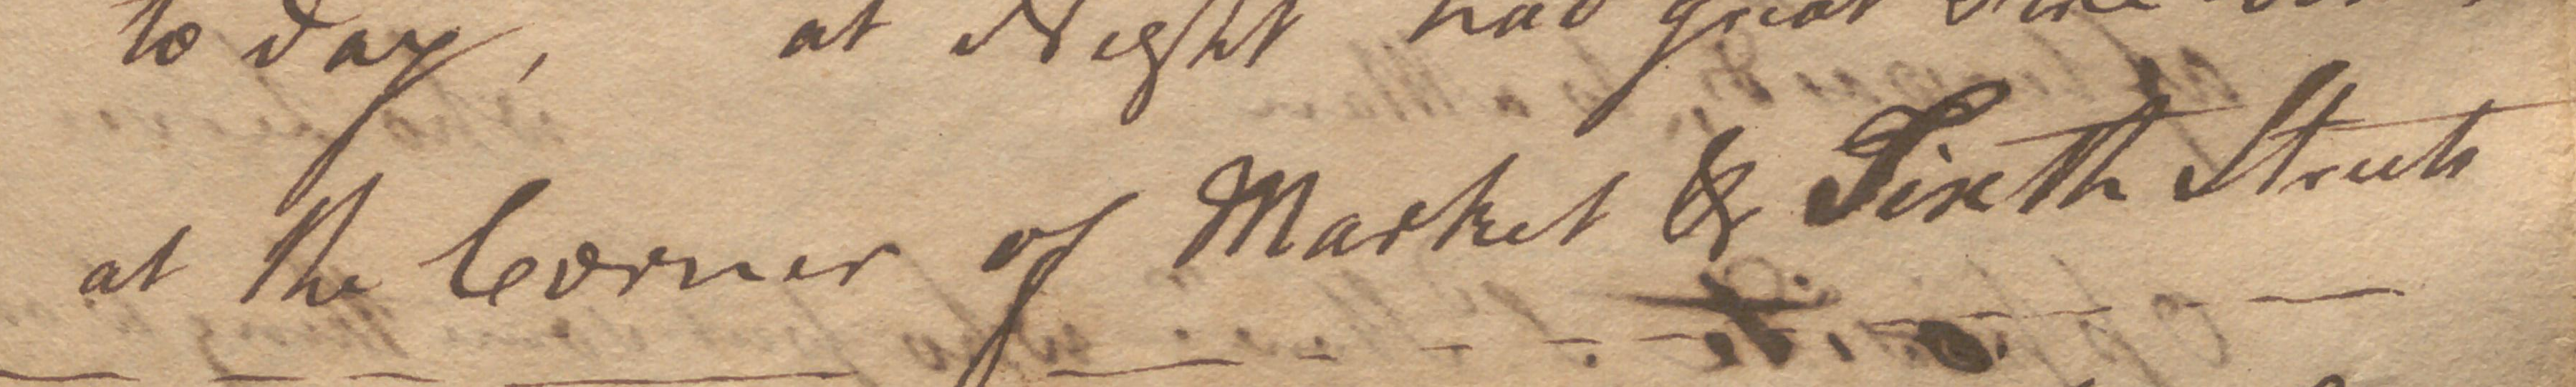at the Corner of Market & Sixth Streets
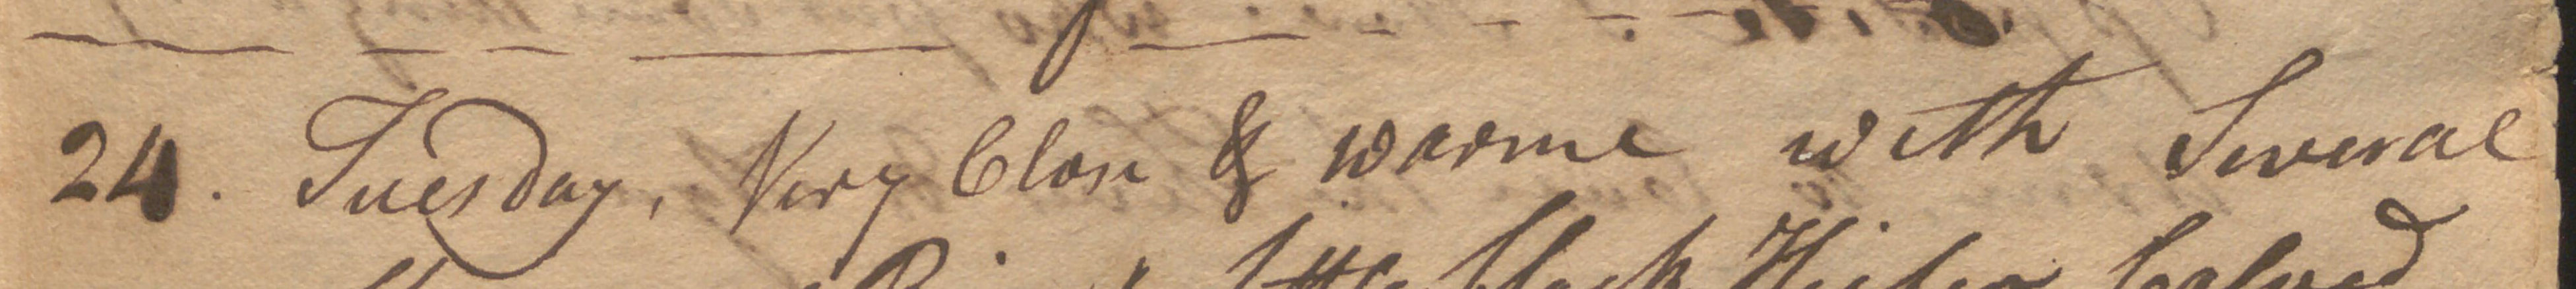24. Tuesday. Very Close & warme with several
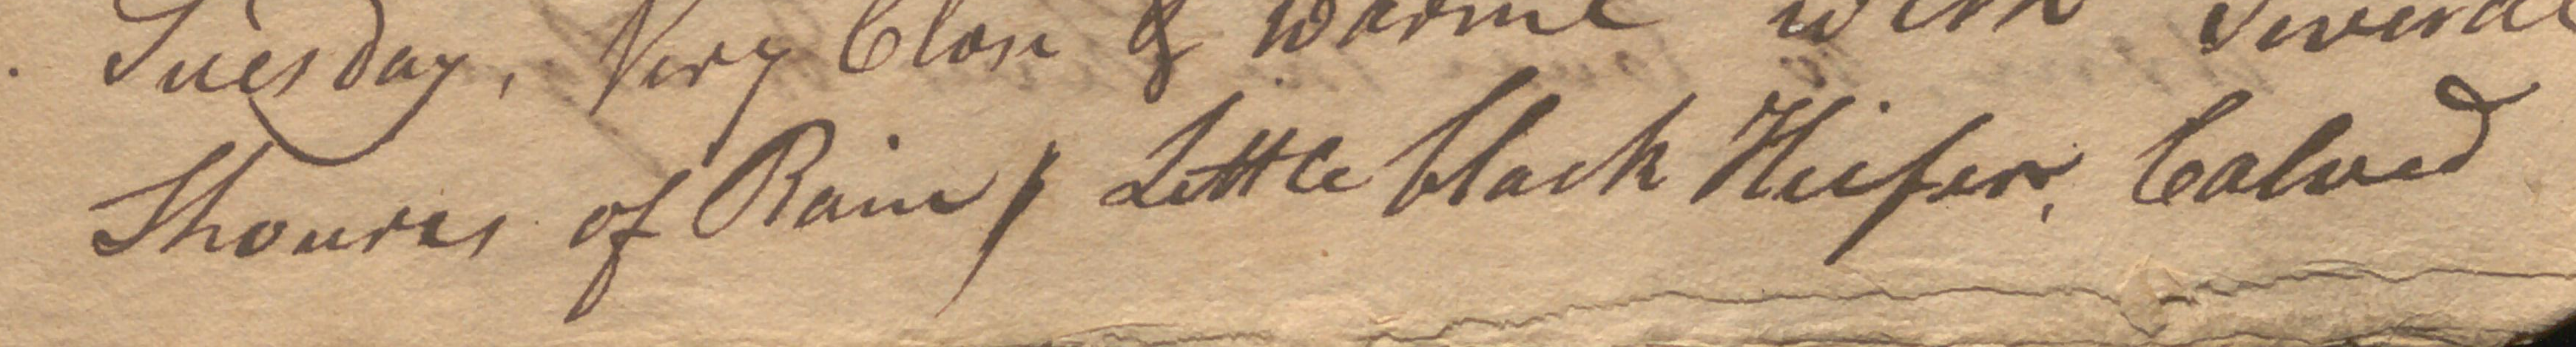Shoures of Rain) Little black Heifer Calved
